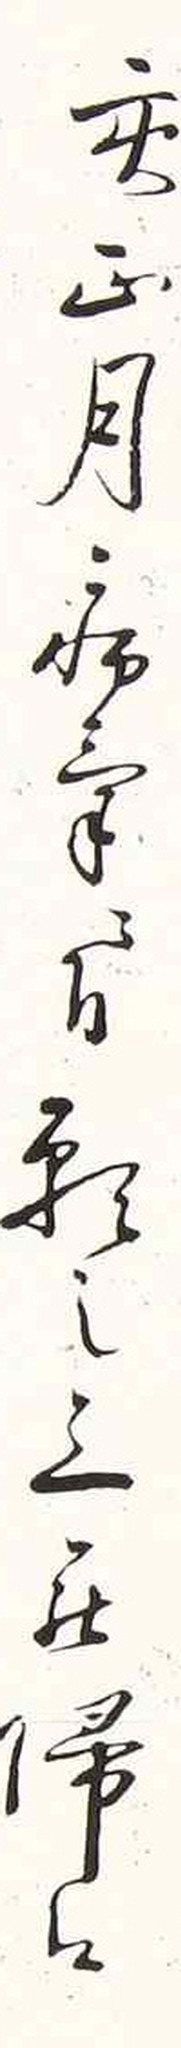亥正月病気ニ付願之上罷帰候
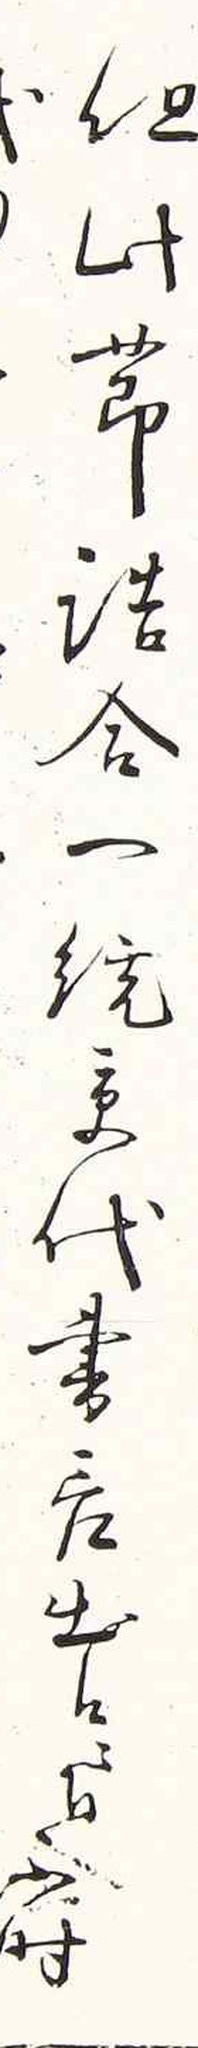但此節詰合一統交代書差出候ニ付不時
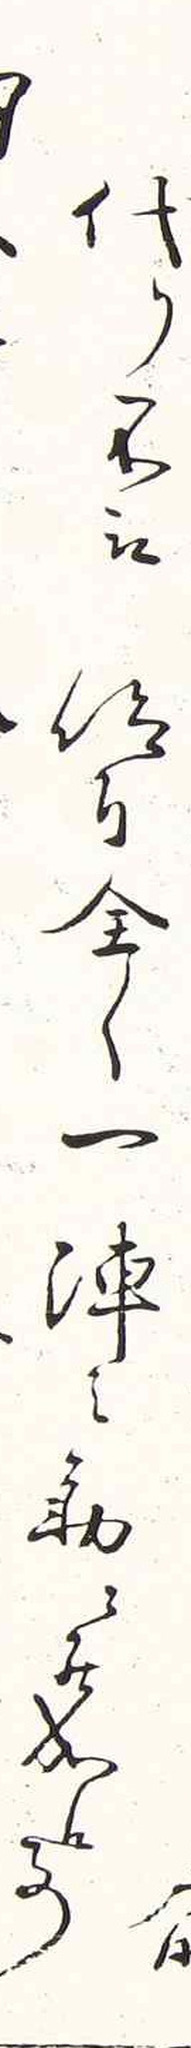代り不被仰付全く一陣之勤ニ罷成候事
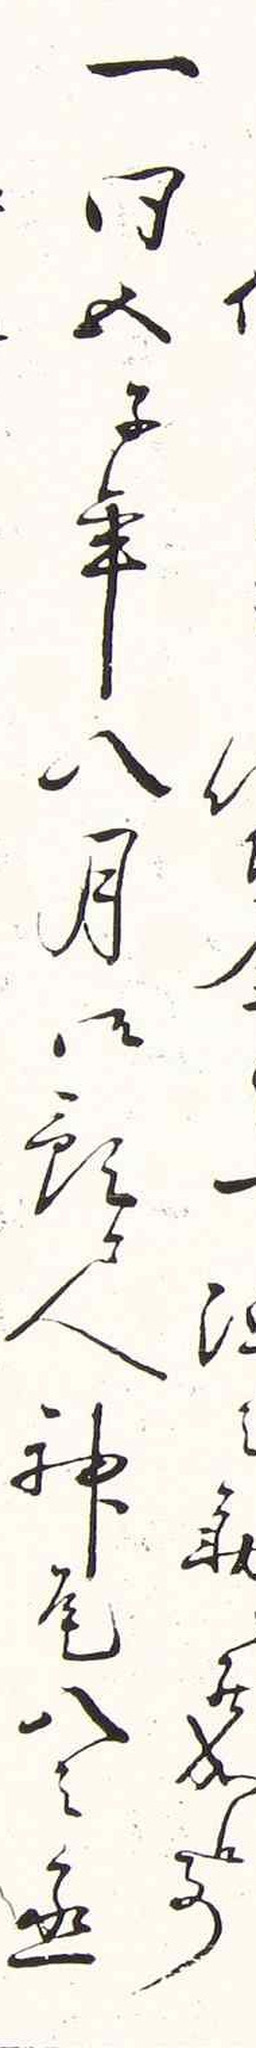一同五子年八月御預ケ人神尾八之丞
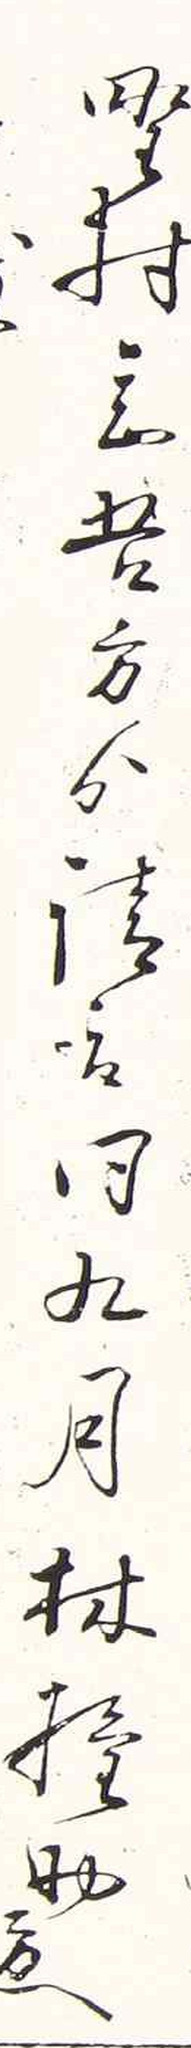野村甚吾方ゟ請取同九月林権助方へ
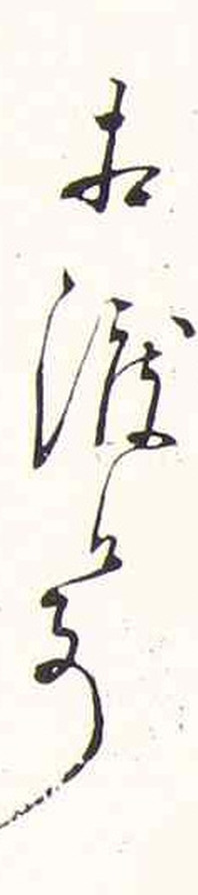相渡候事

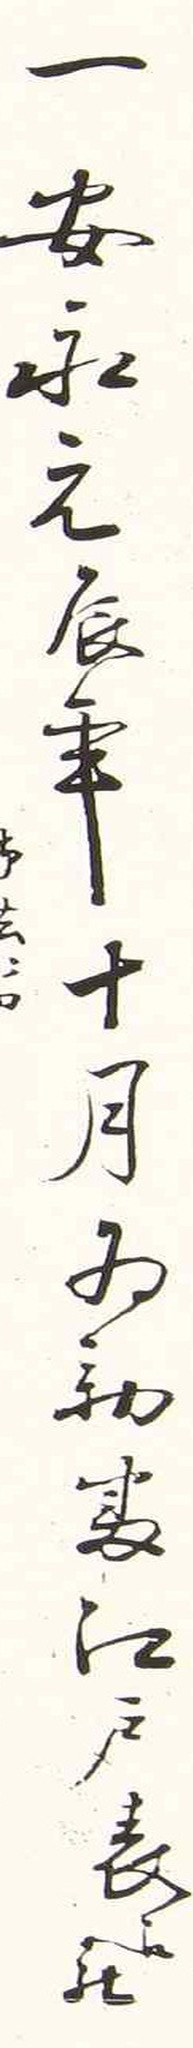一安永元辰年十月為勤番江戸表江罷
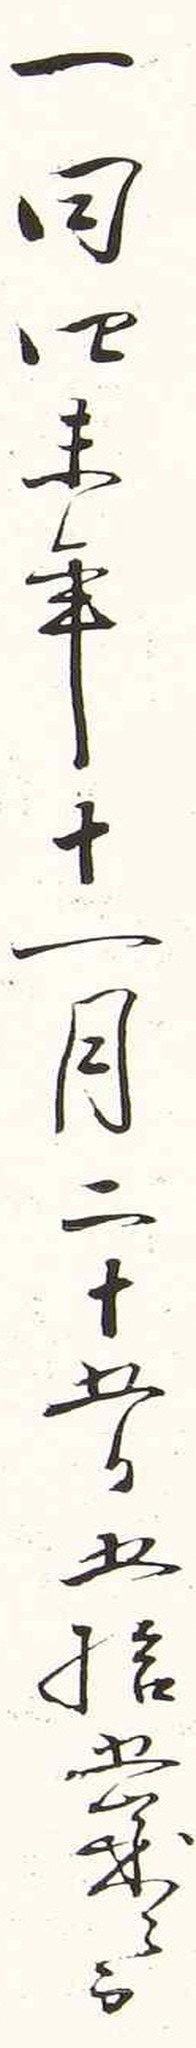一同四未年十一月二十五日五拾五歳ニ而
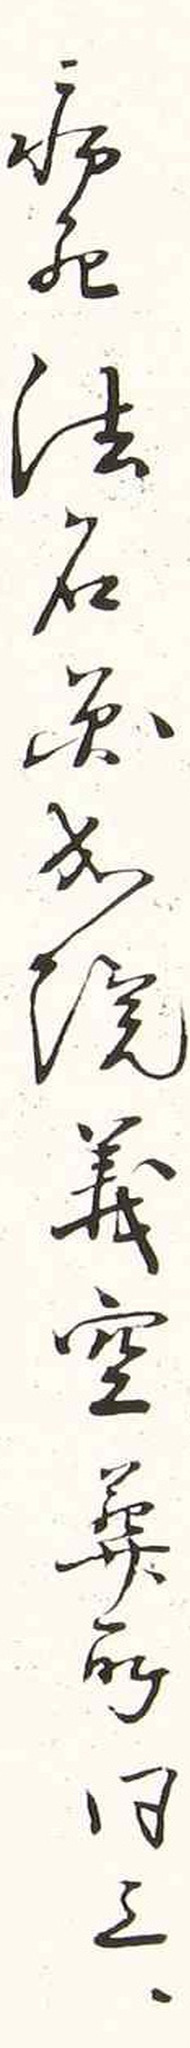病死法名円成院義空葬所同上
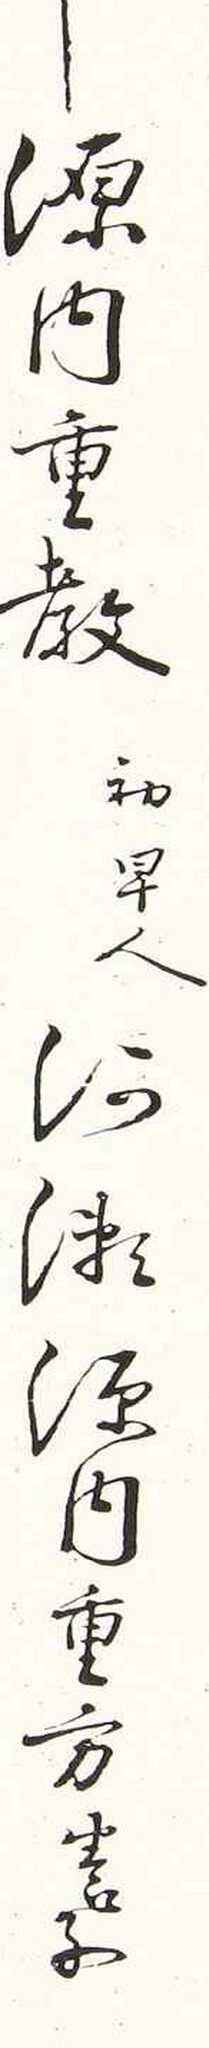源内重教初早人河瀬源内重方養子
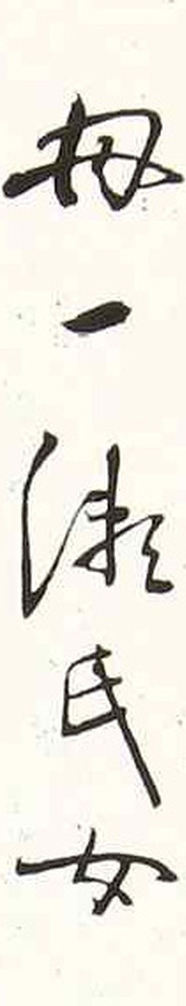母一瀬氏女
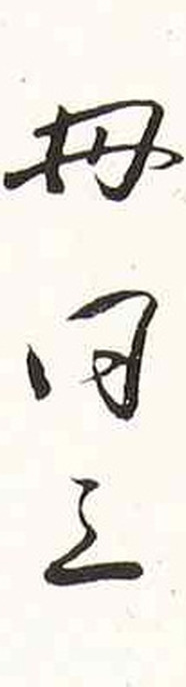母同上
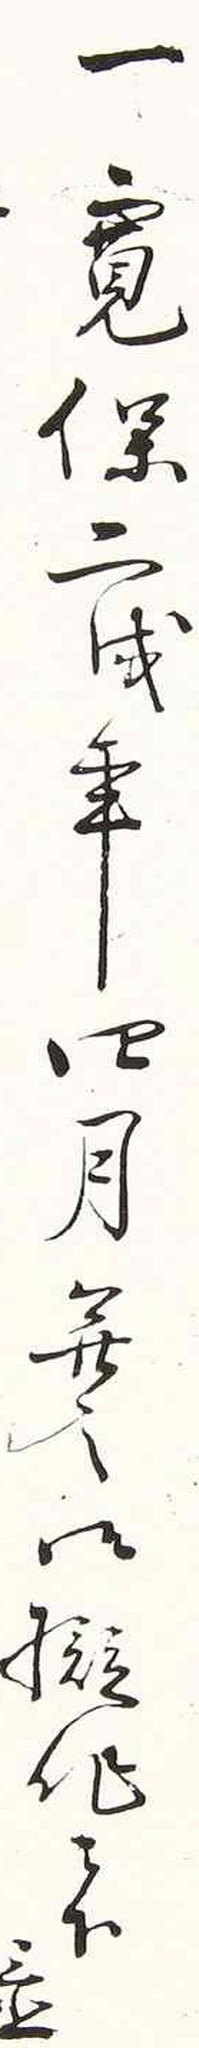一寛保二戌年四月並之御擬作被下置
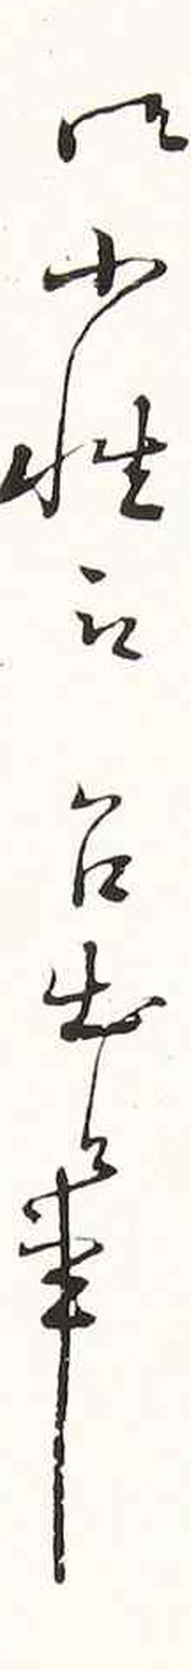御小性被召出候事
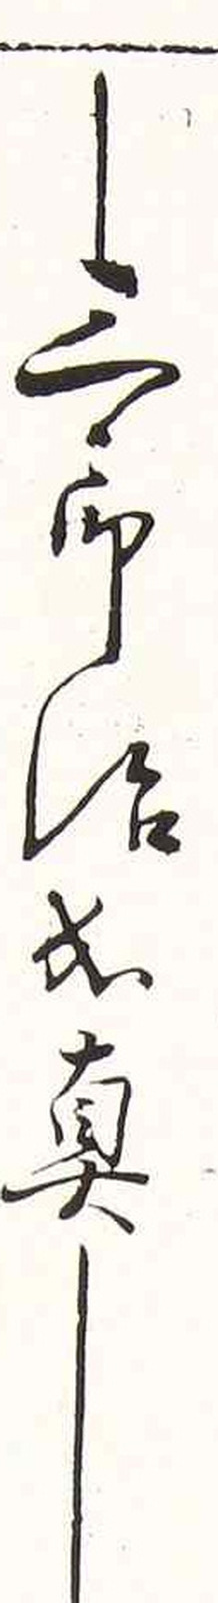三郎治成真
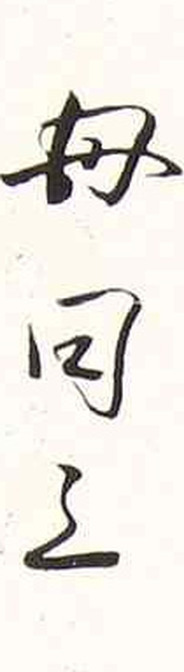母同上
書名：諸士系譜　巻之357　す之部7
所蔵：会津若松市立会津図書館
